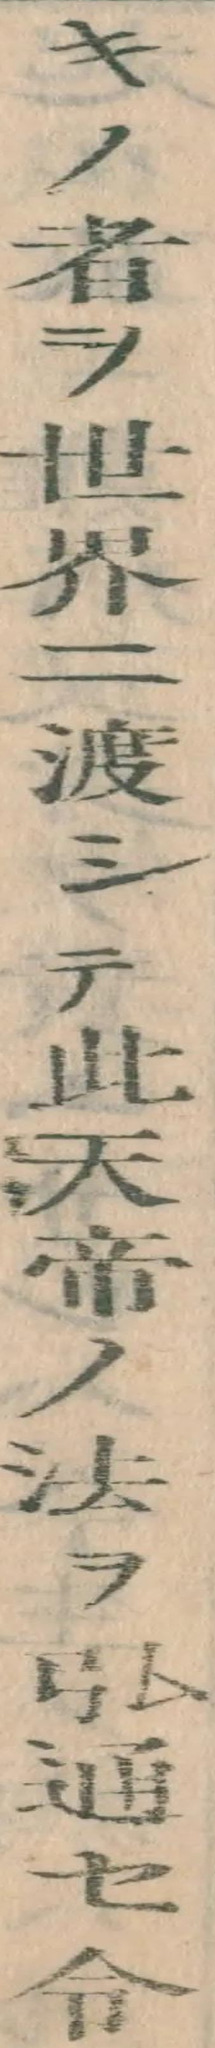キノ者ヲ世界ニ渡シテ此天帝ノ法ヲ弘通セ令
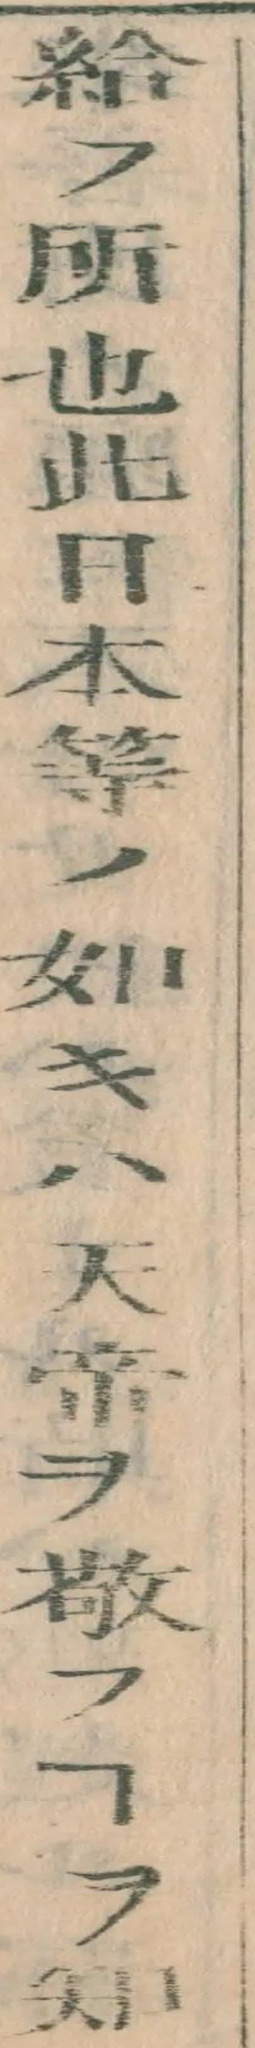給フ所也此日本等ノ如キハ天帝ヲ敬フヿヲ知
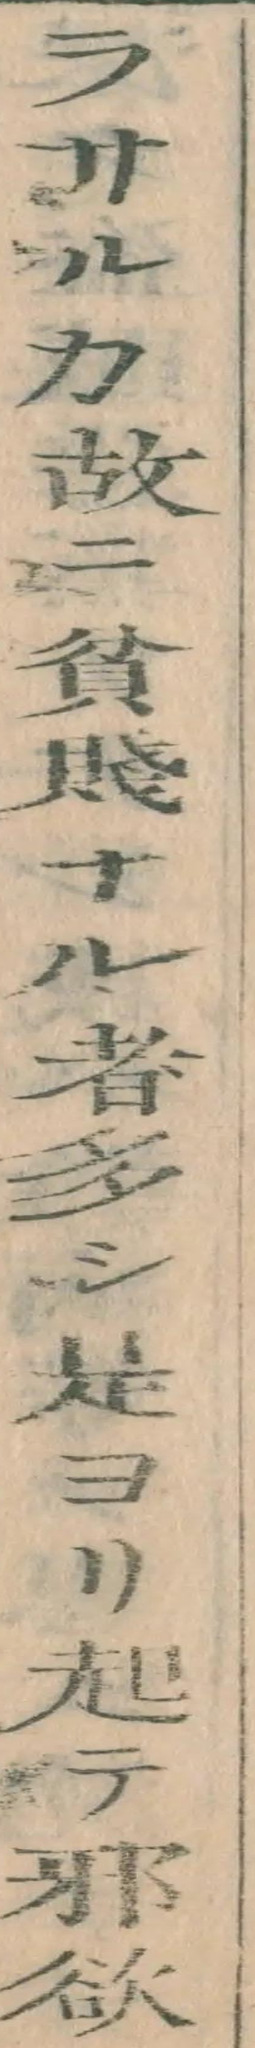ラサルカ故ニ貧賤ナル者多シ是ヨリ起テ邪欲

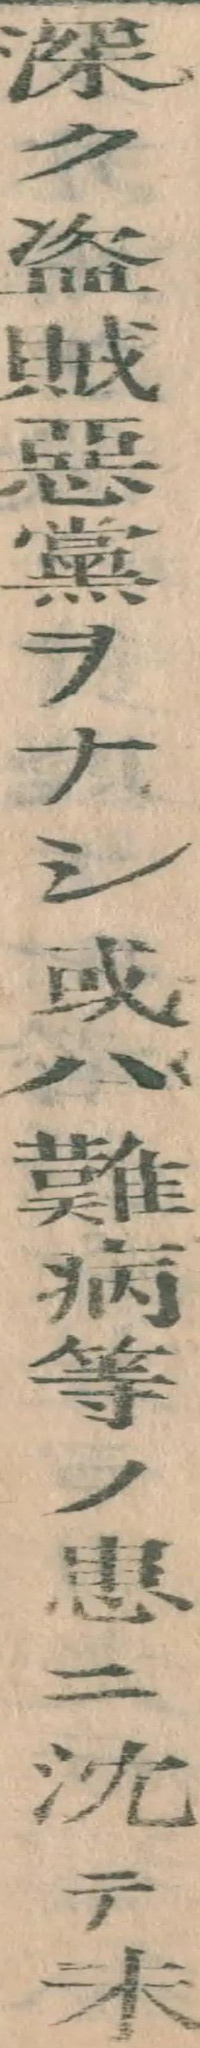深ク盗賊悪党ヲナシ或ハ難病等ノ患ニ沈テ未
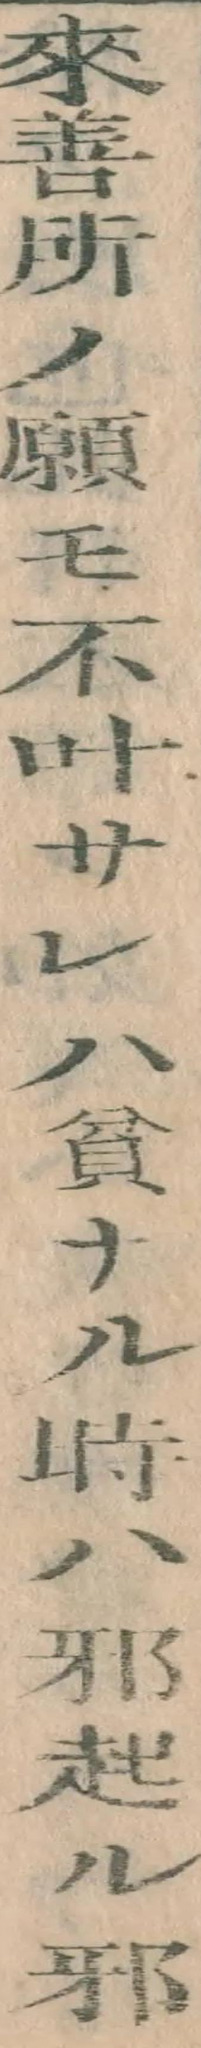来善所ノ願モ不叶サレハ貧ナル時ハ邪起ル邪
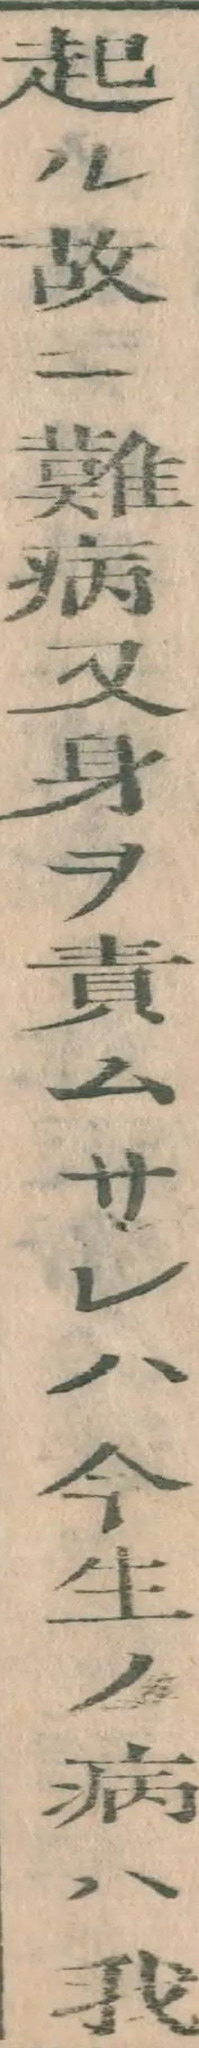起ル故ニ難病又身ヲ責ムサレハ今生ノ病ハ我
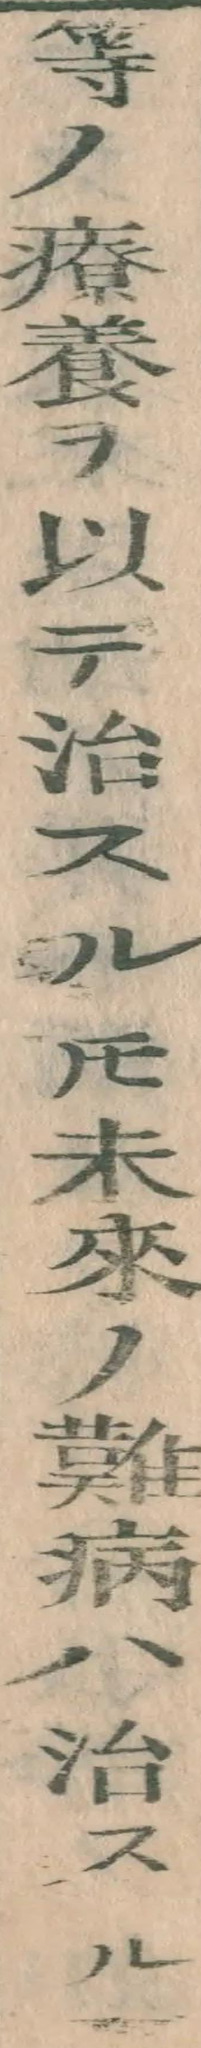等ノ療養ヲ以テ治スルトモ未来ノ難病ハ治スル
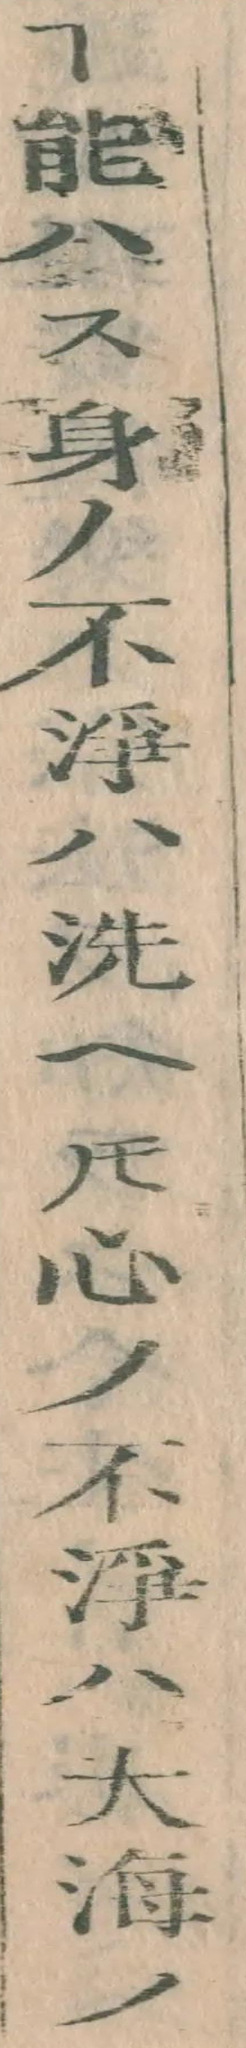ヿ能ハス身ノ不浄ハ洗ヘトモ心ノ不浄ハ大海ノ
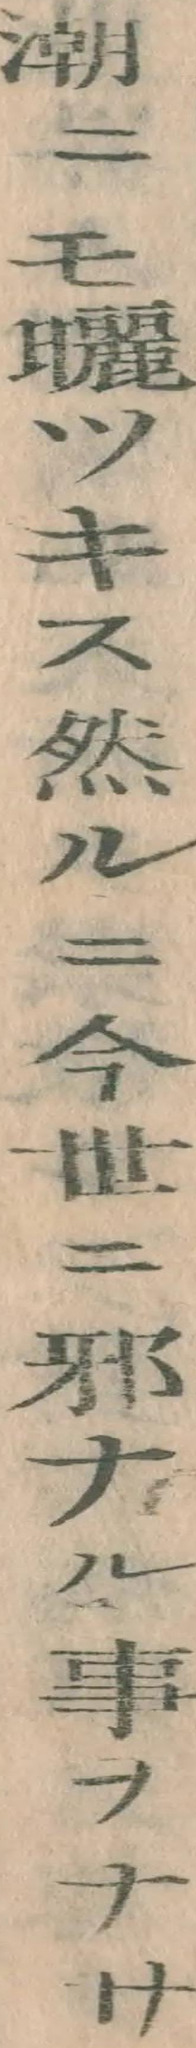潮ニモ晒ツキス然ルニ今世ニ邪ナル事ヲナサ
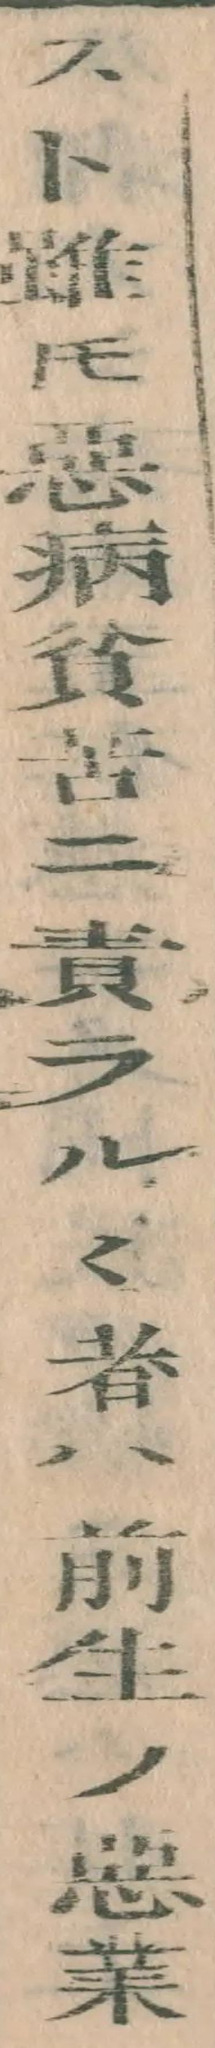スト雖トモ悪病貧苦ニ責ラル〱者ハ前生ノ悪業
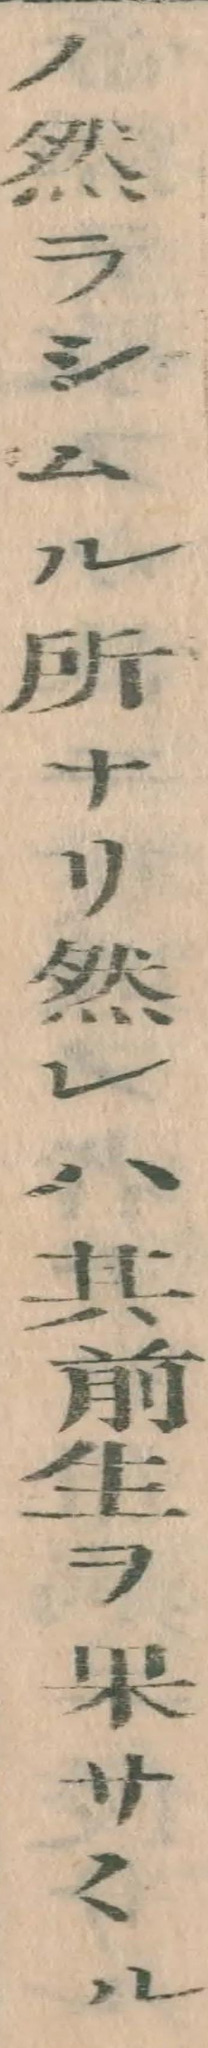ノ然ラシムル所ナリ然レハ其前生ヲ果サ〱ル
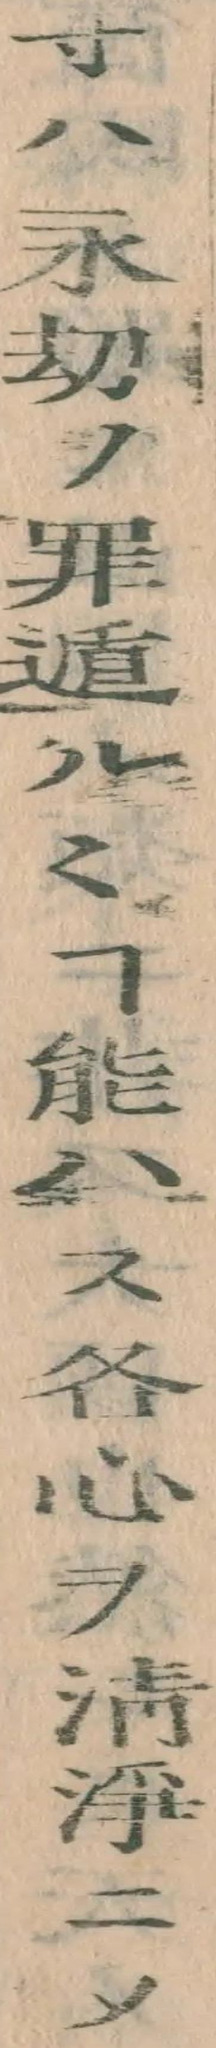寸ハ永刧ノ罪遁ル〱ヿ能ハス各心ヲ清浄ニシテ
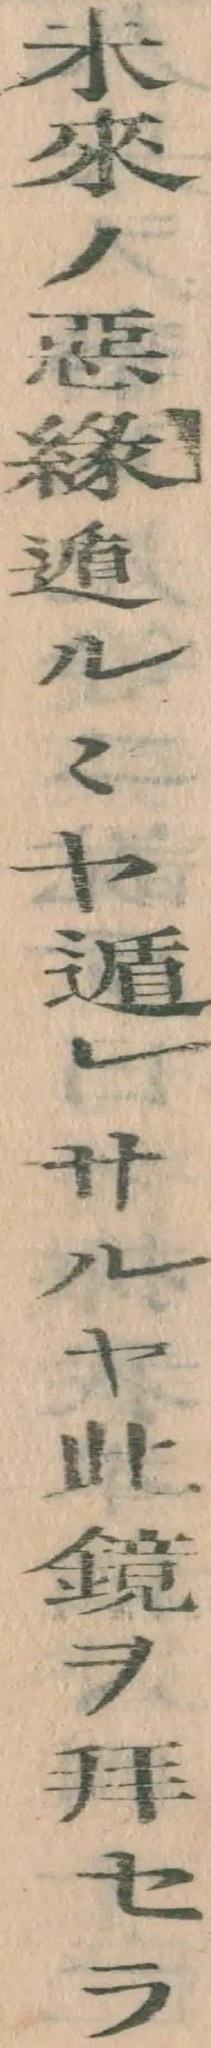未来ノ悪縁遁ル〱ヤ遁レサルヤ此鏡ヲ拝セラ
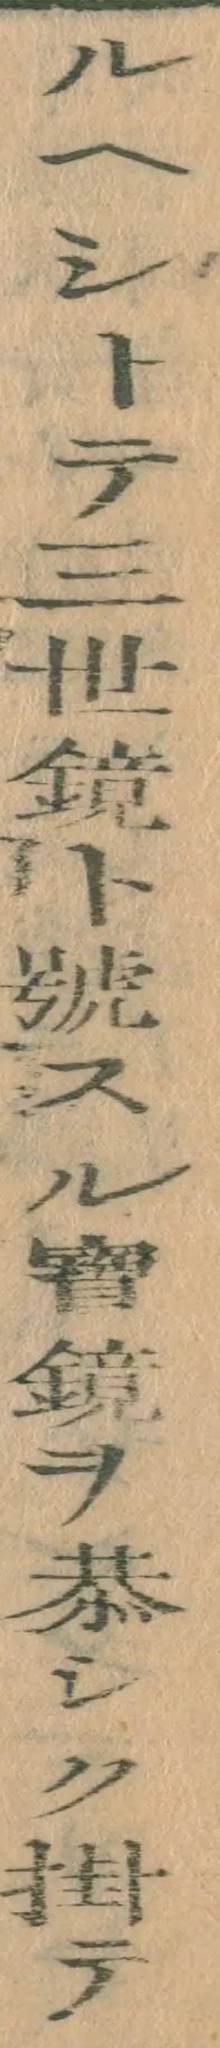ルヘシトテ三世鏡ト号スル宝鏡ヲ恭シク掛テ
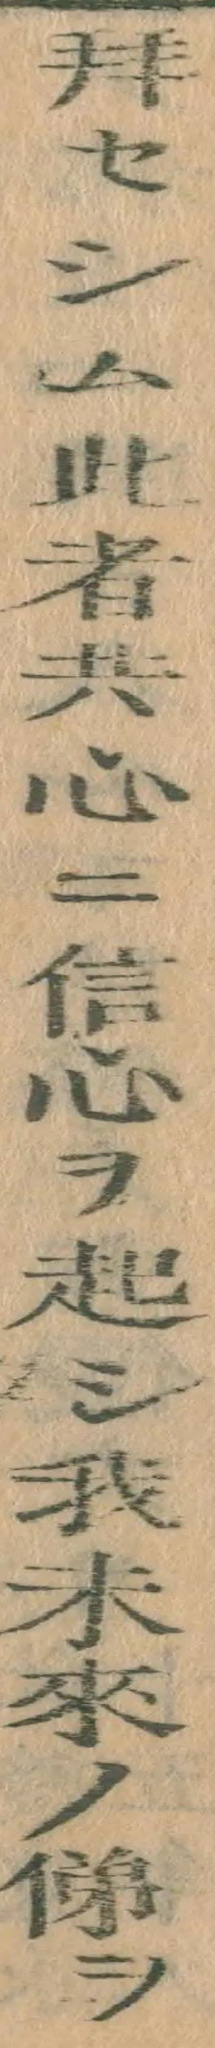拝セシム此者共心ニ信心ヲ起シ我未来ノ俤ヲ
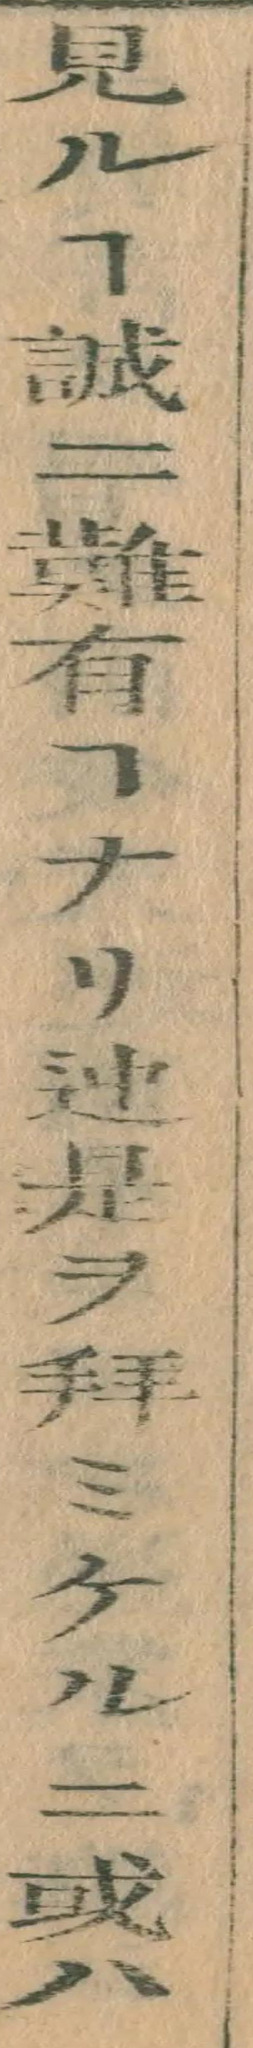見ルヿ誠ニ難有ヿナリ迚是ヲ拝ミケルニ或ハ
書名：南蛮寺興廃記
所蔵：国立国会図書館 National Diet Library, JAPAN
